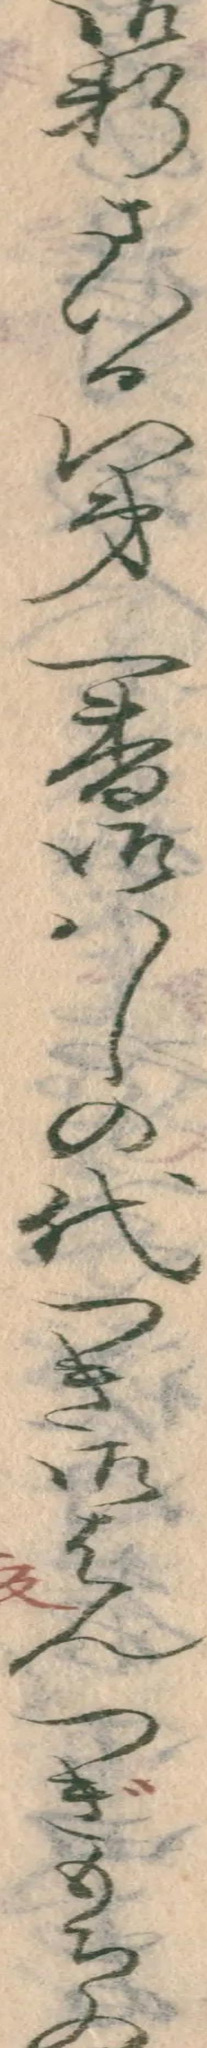御料まいる次第一番御はしの代つき御はんつぎもちゐ
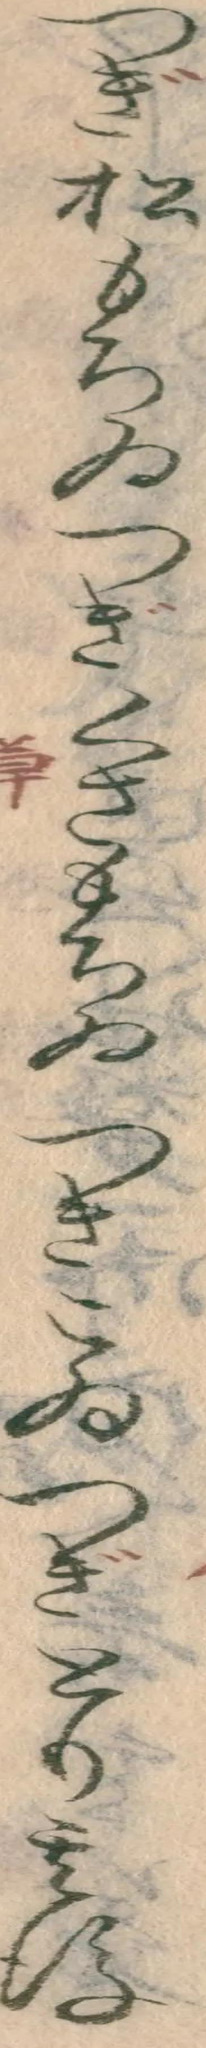つぎ松もちゐつぎくさもちゐつきこゐつぎとり其後
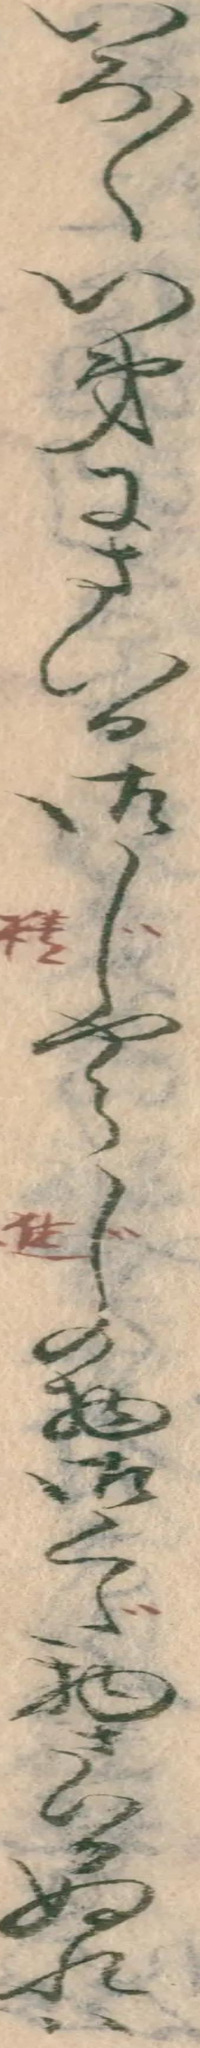いろ〳〵次第にまいる御じやうじの物御くだ物まいりぬれは
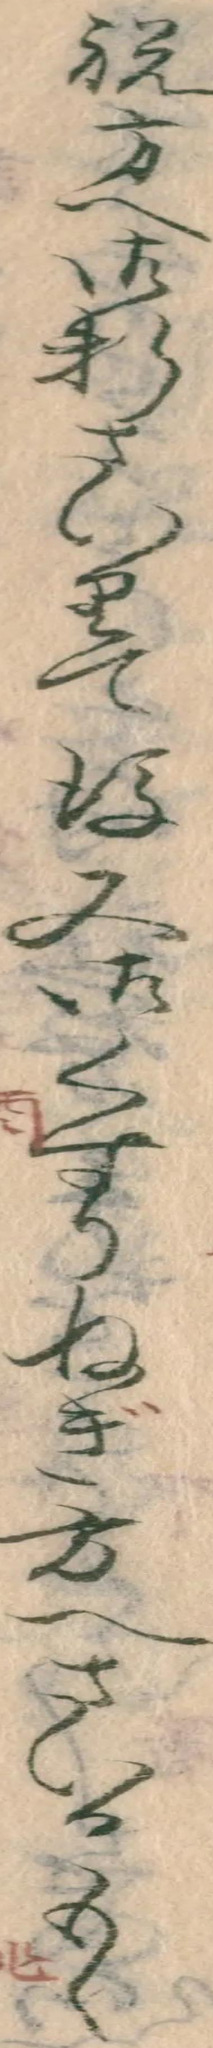祝方へ御料まいりて後又御くすりねぎ方へまいるもゝ
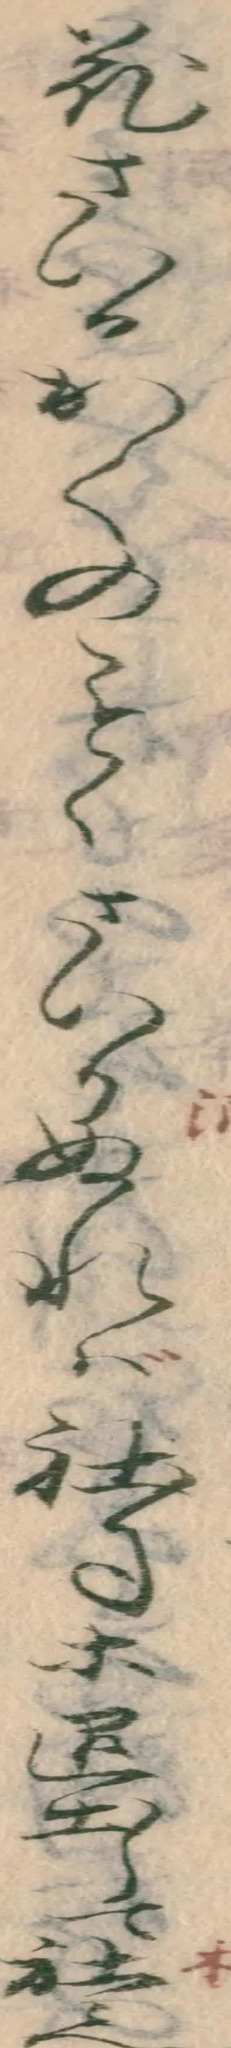花まいるかくのことくまいりぬれば社司等退出して社々へ
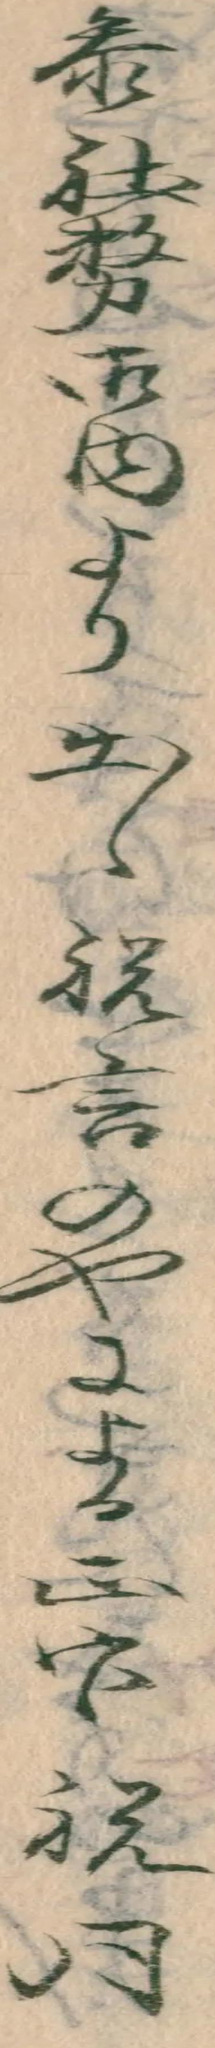参社務御内より出候祝言のやによる正官祝月
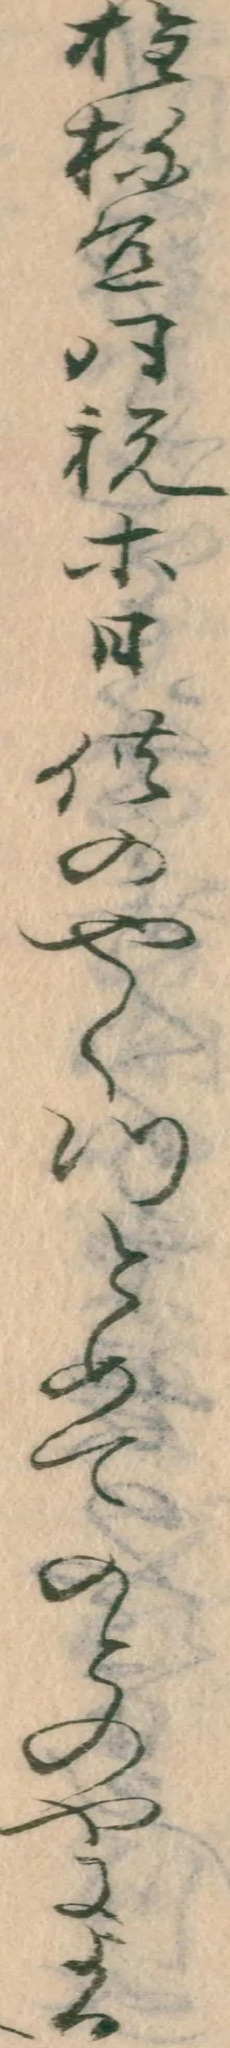権祢宜月祝等日供のやくつとめてのとのやによる
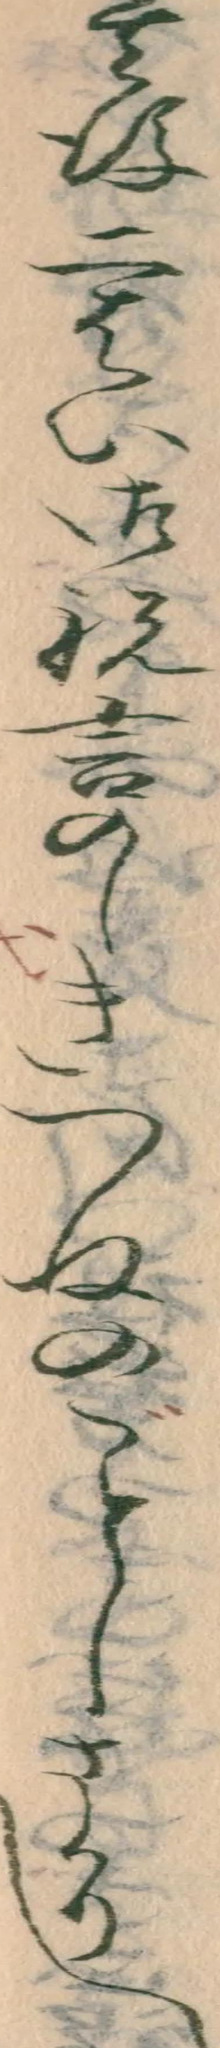其後二はい御祝言のしきつねのごとしさかり
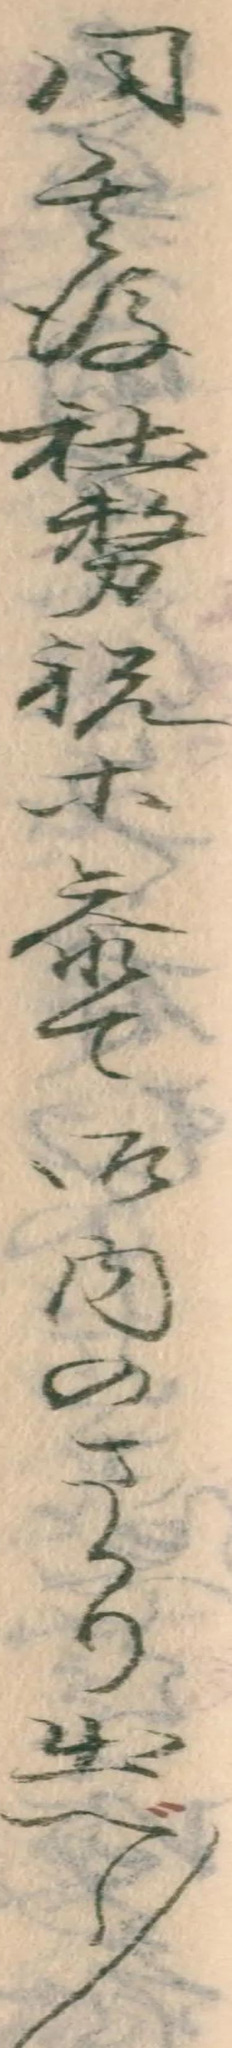同其後社務祝等参て御内のまかり出べし
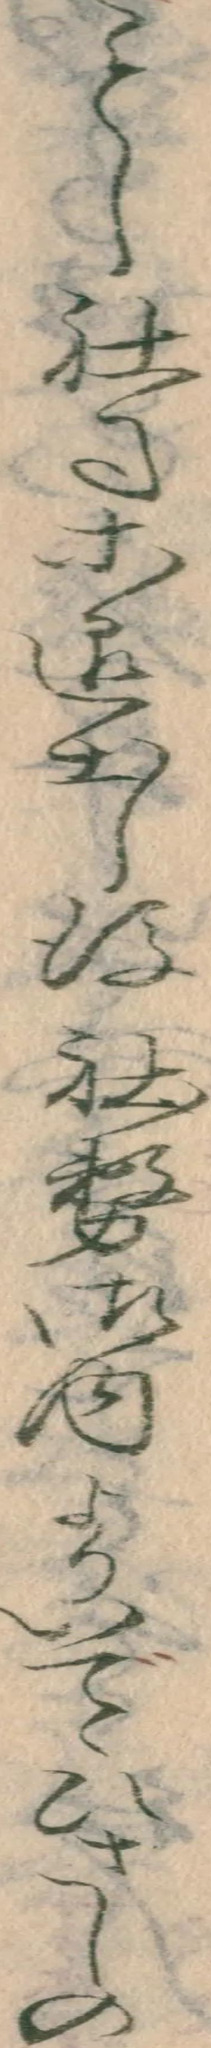ごとし社司等退出し後社務御内よりいでゝひさしの
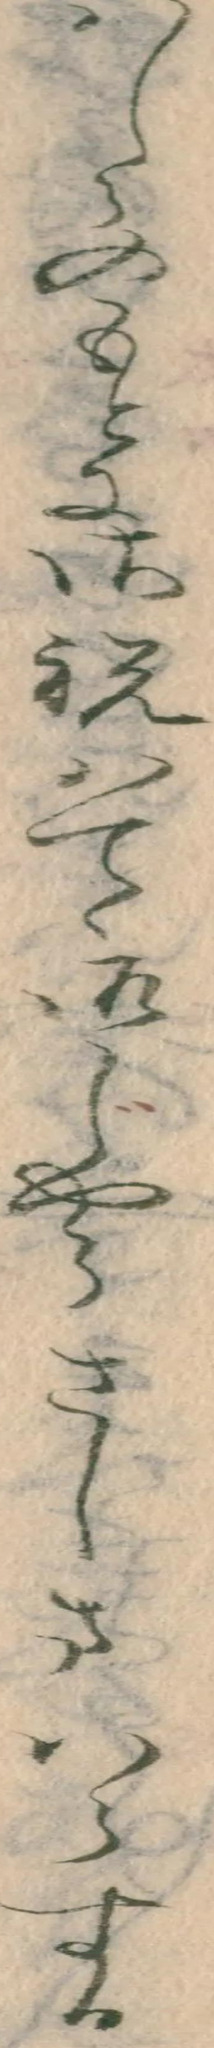はしらのもとに御祝はてゝ御じやうさしまいらする
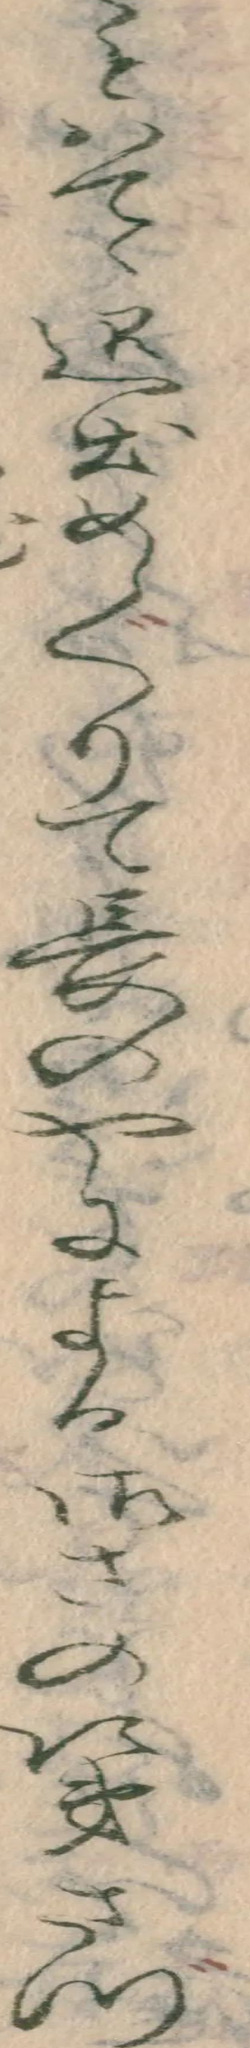ことはてゝ退出めぐりて長のやによる御さの次第まづ
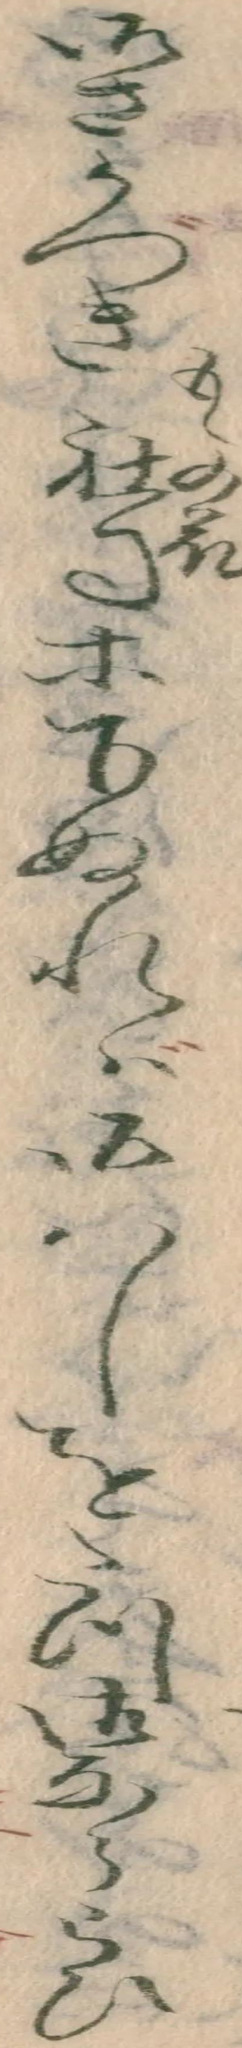御さかづき社司等下ぬれば御はしをたつ御なうらひ
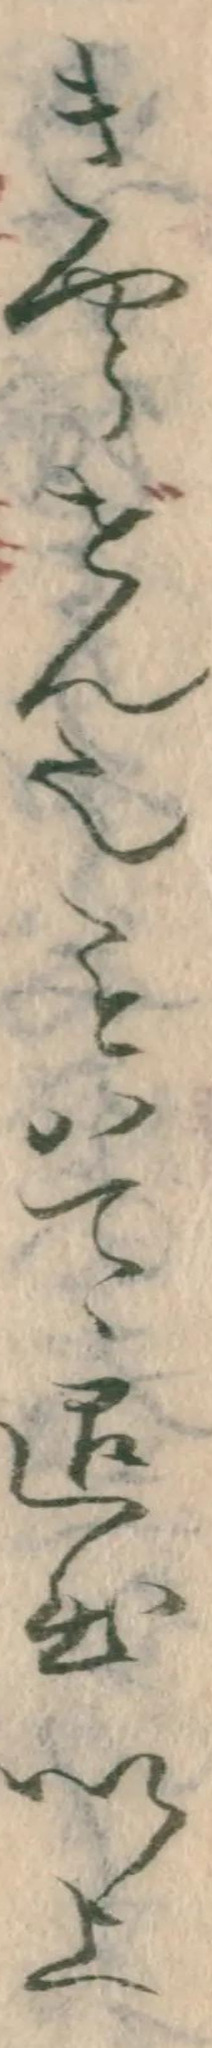きやうぜん也ことはてゝ退出以上

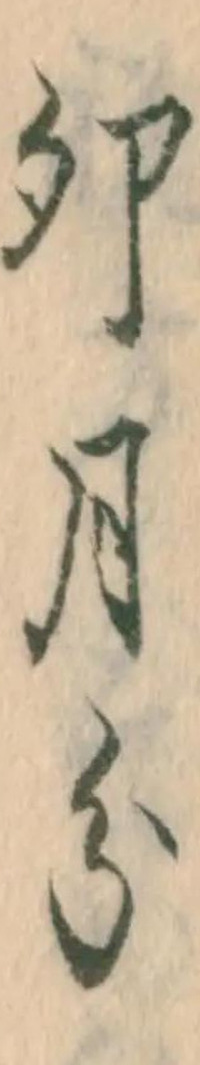卯月分
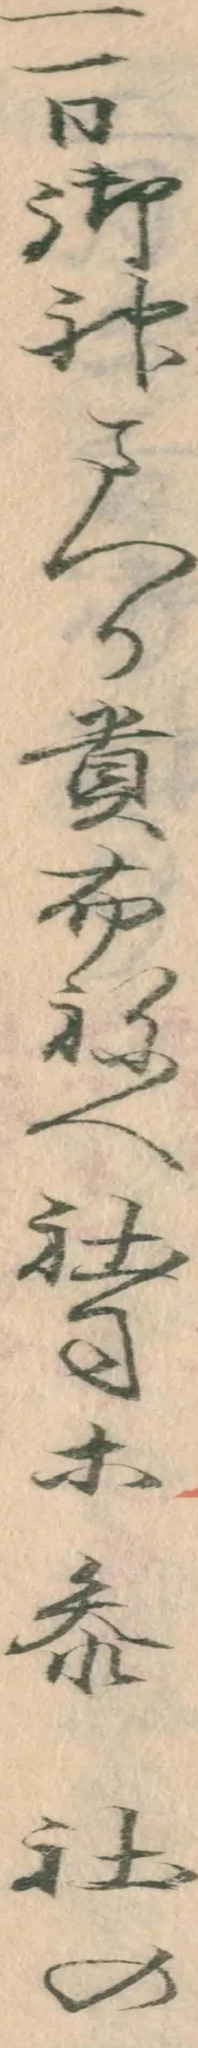一一日御神まつり貴布祢へ社司等参社の
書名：賀茂社記録. 第3冊
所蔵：国立国会図書館 National Diet Library, JAPAN
